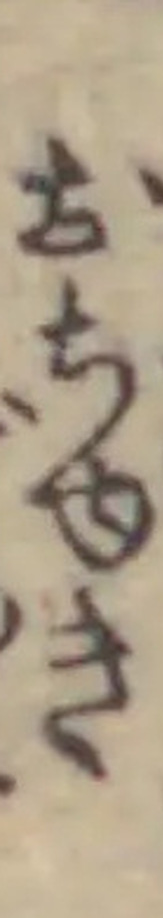おちゆき
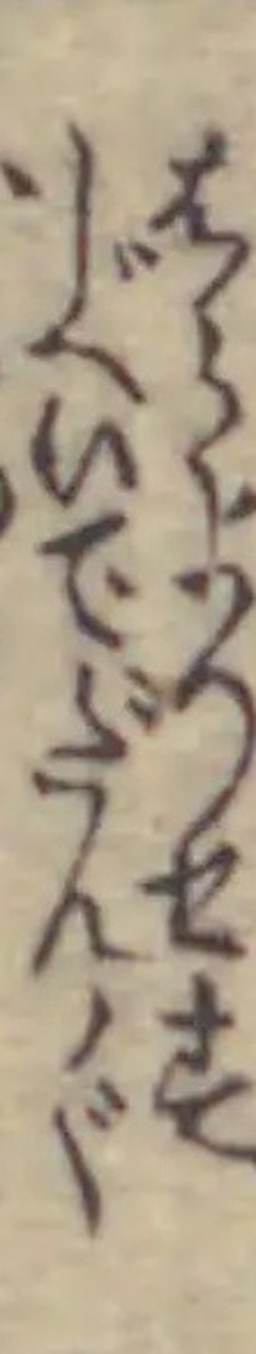じへいでだん〴〵
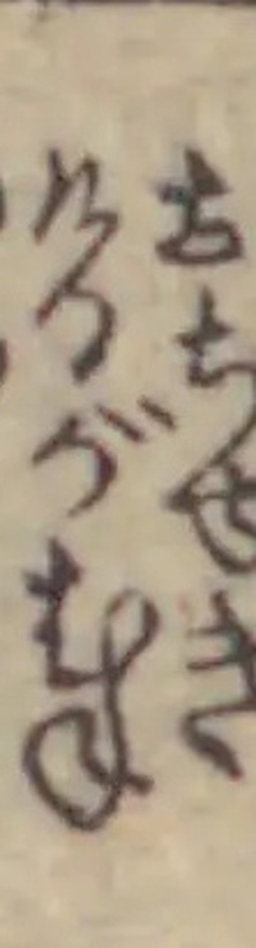けるがむね
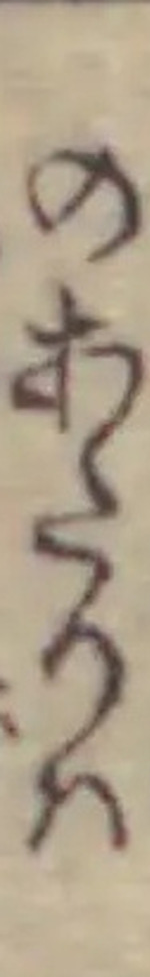のあたりは
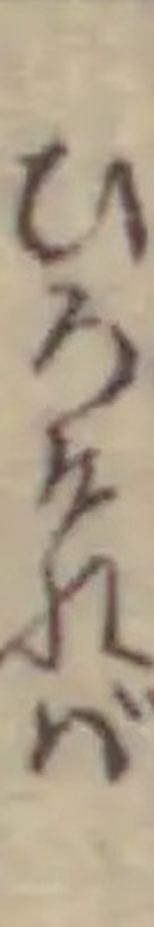ひろければ
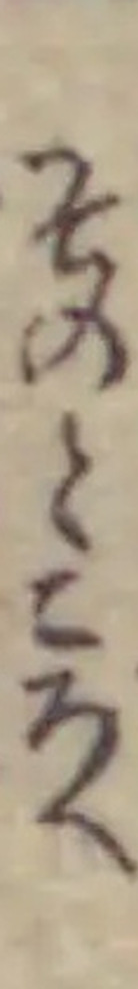そのところへ
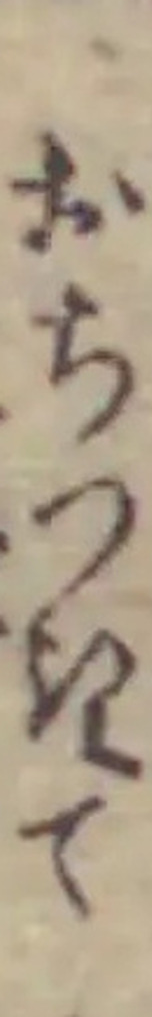おちつきて
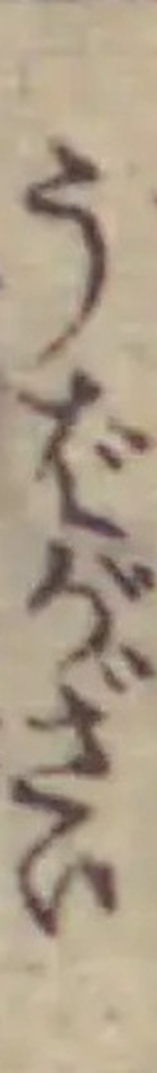うばがざい
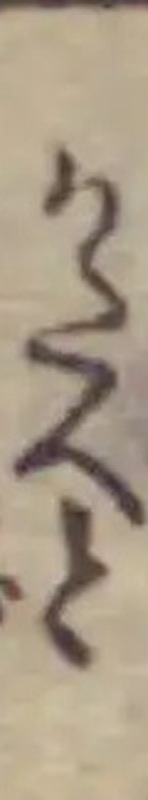かたへと
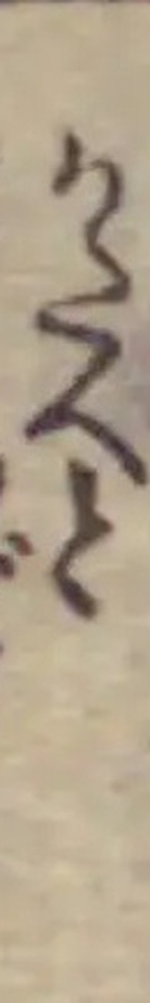かたへと
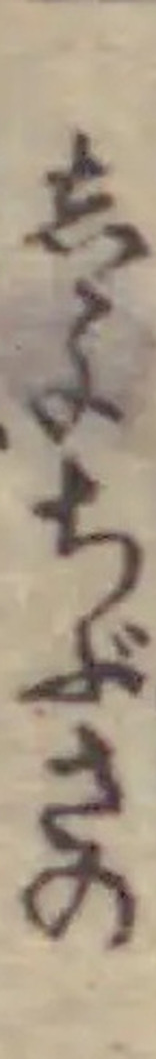しよちぶさの
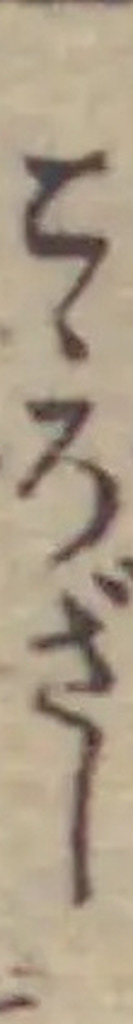こころざし
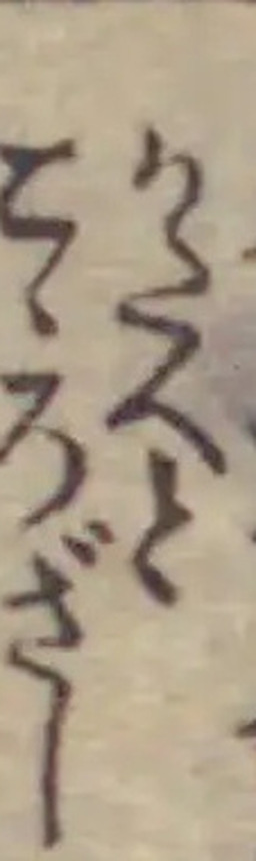こころざし
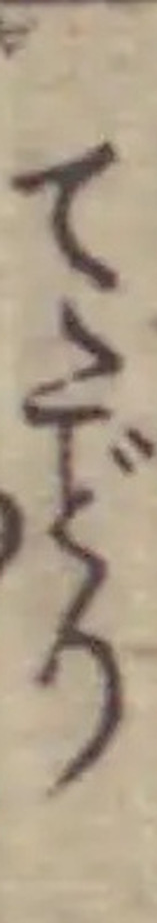てたどり
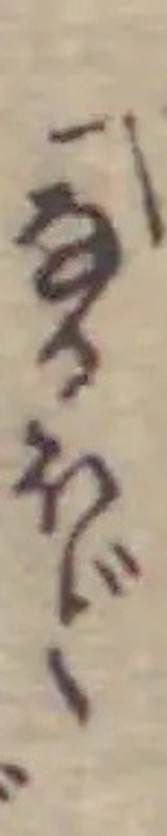〽なかほど
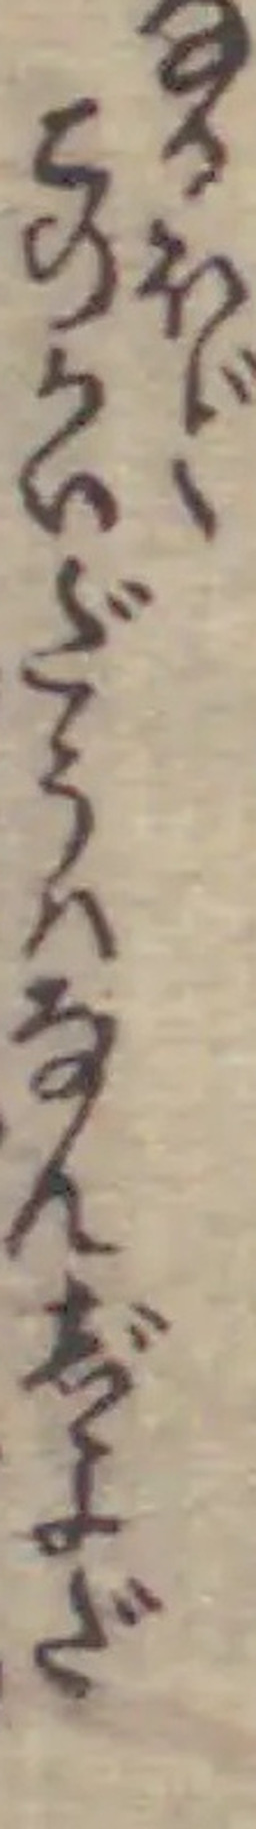このかいだうはなんじよだ
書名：腹内養生主論 3巻
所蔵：国立国会図書館 National Diet Library, JAPAN
